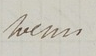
Besprechung
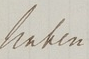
haben
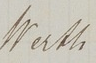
kann.
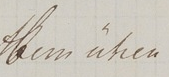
mich bemühen
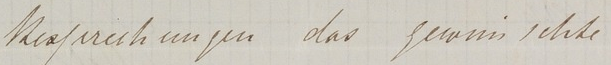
Besprechungen das gewünschte
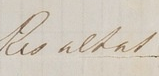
Resultat
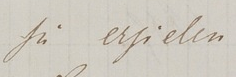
zu erzielen
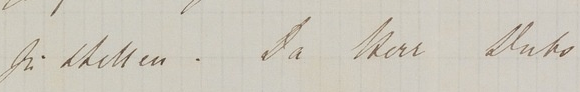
zu stellen. Da Herr Dubs
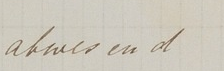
abwesend sein wird,
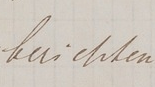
wohl kaum vor
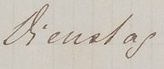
Dienstag
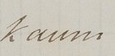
berichten
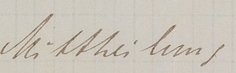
Mittheilung
